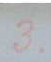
69.
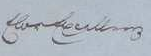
Ewr Excellenz
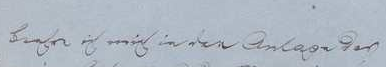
beehre ich mich in der Anlage das
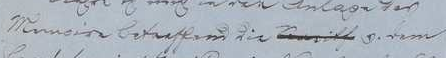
Memoire betreffend die S...ith v. dem
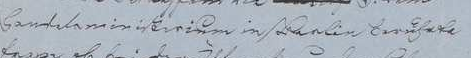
Handelsministerium in Berlin berührte
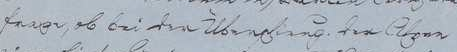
Frage, ob bei der Überschienung der Alpen
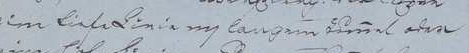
eine tiefe Linie mit langem Tunnel oder
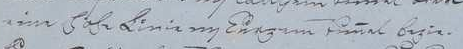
eine hohe Linie mit kurzem Tunnel bezie-
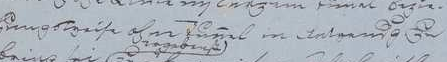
hungsweise ohne Tunnel in Anwendung zu
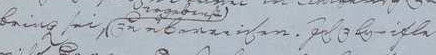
sei,ergebenst zu überreichen. Ich zweifle
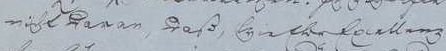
nicht daran, daß, wie Ewr Excellenz
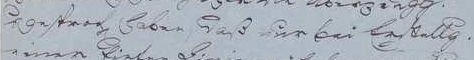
ausgesprochen haben, daß nur bei Erstellung
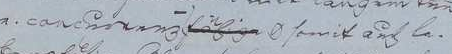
e. concurrenz-fähige & somit auch le-
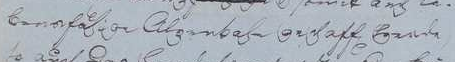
bensfähige Alpenbahn geschaffen werde,
